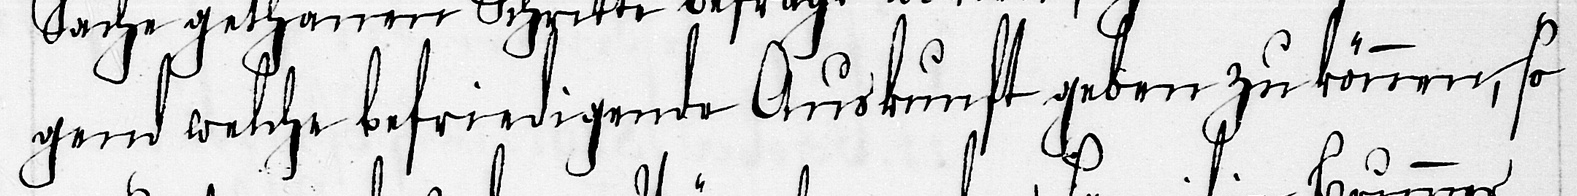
gend welche befriedigende Auskunft geben zu können, so
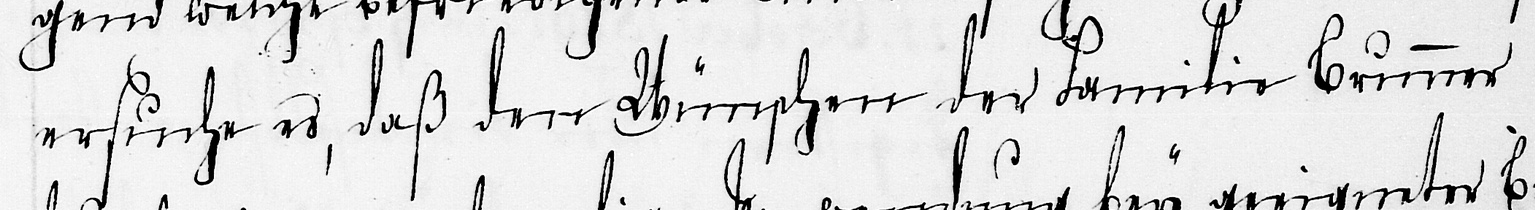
versuche es, daß den Wünschen der Familie Brunner
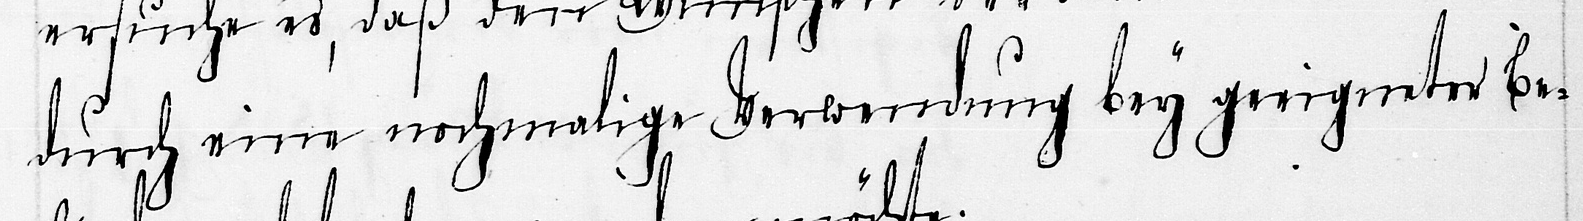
durch eine nochmalige Verwendung bey geeigneter Be¬
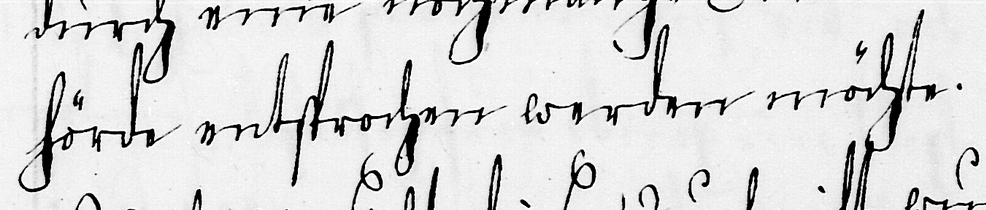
hörde entsprochen werden möchte.
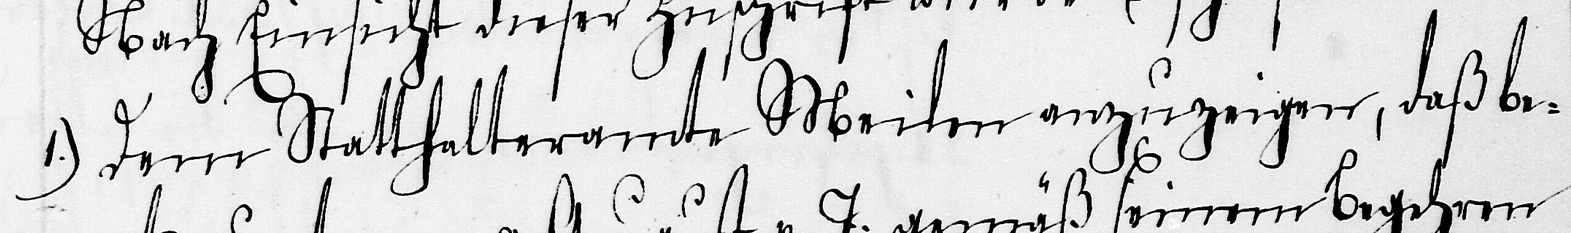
1.) Dem Statthalteramte Meilen anzuzeigen, daß be¬
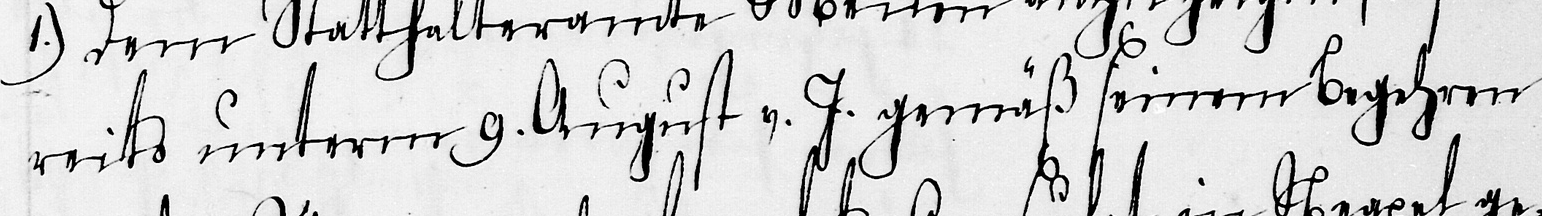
reits unterm 9. August v. J. gemäß seinem Begehren
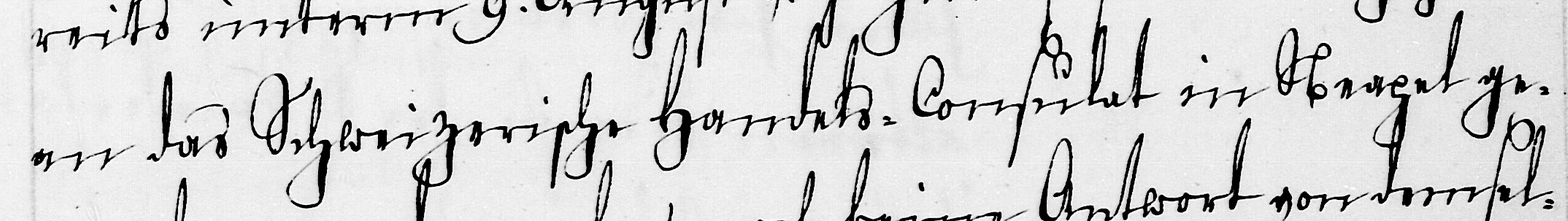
an das Schweizerische Handels-Consulat in Neapel ge¬
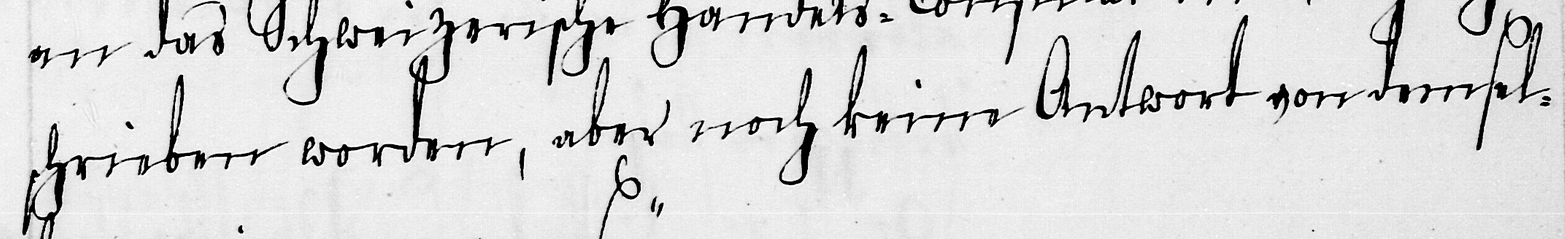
schrieben worden, aber noch keine Antwort von demsel¬
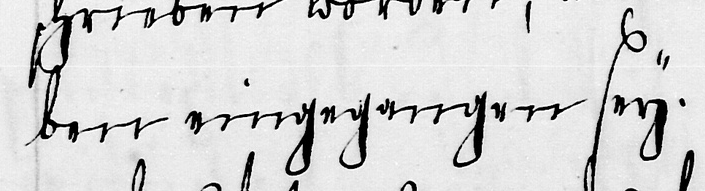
ben eingegangen sey.
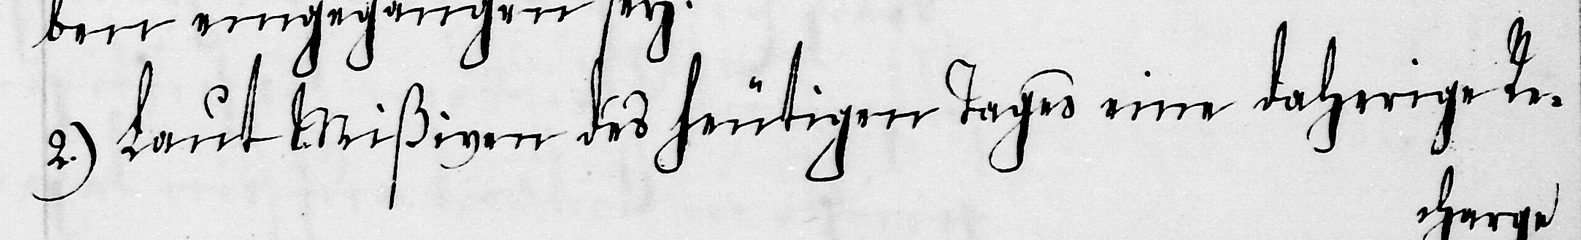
2.) Laut Mißiven des heutigen Tages eine daherige Re-
